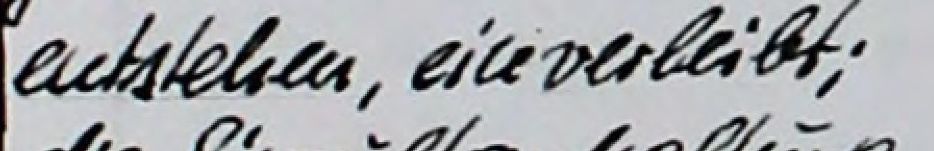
entstehen, einverleibt;
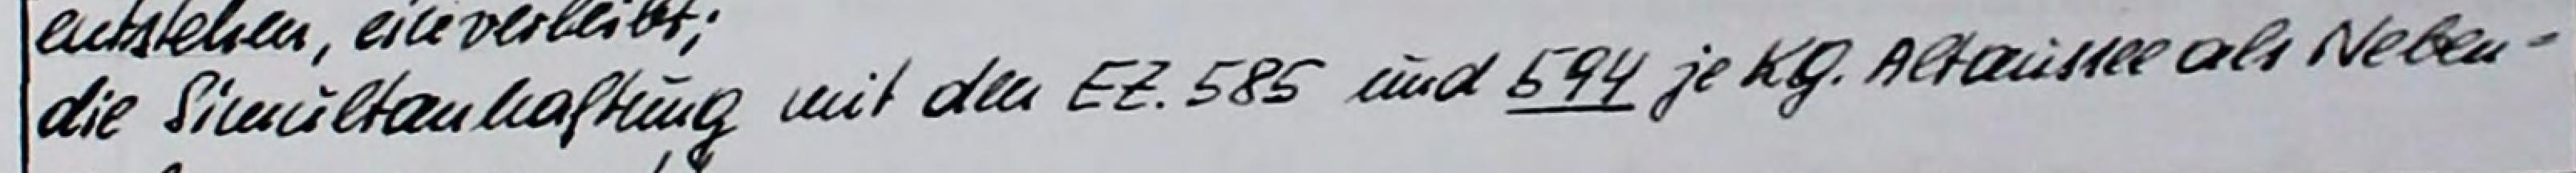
die Simultanhaftung mit den EZ. 585 und 594 je KG. Altaussee als Neben=
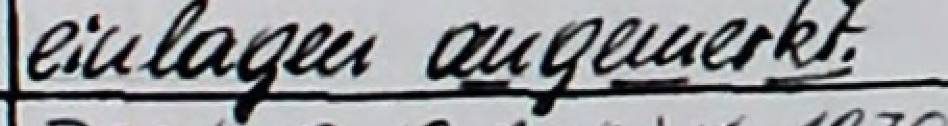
einlagen angemerkt.
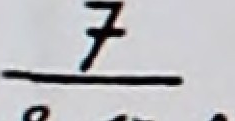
7
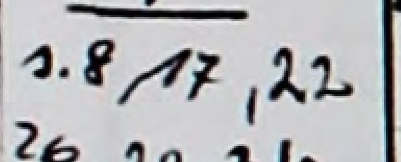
s. 8, 17, 22
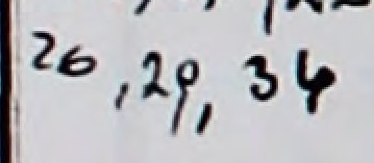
26, 29, 36
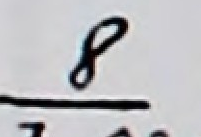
8
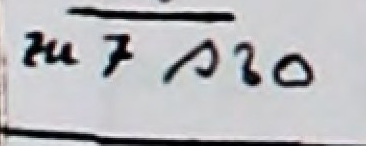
zu 7 s 20
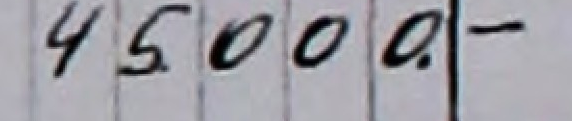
45000.
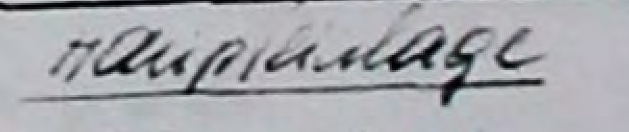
Haupteinlage
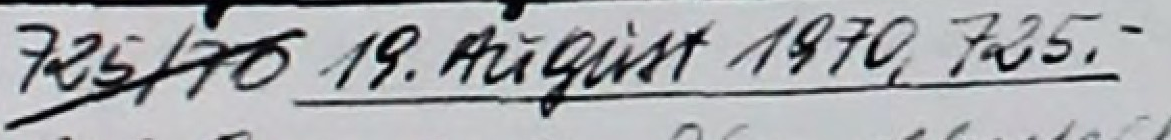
725/70 19. August 1970, 725.-
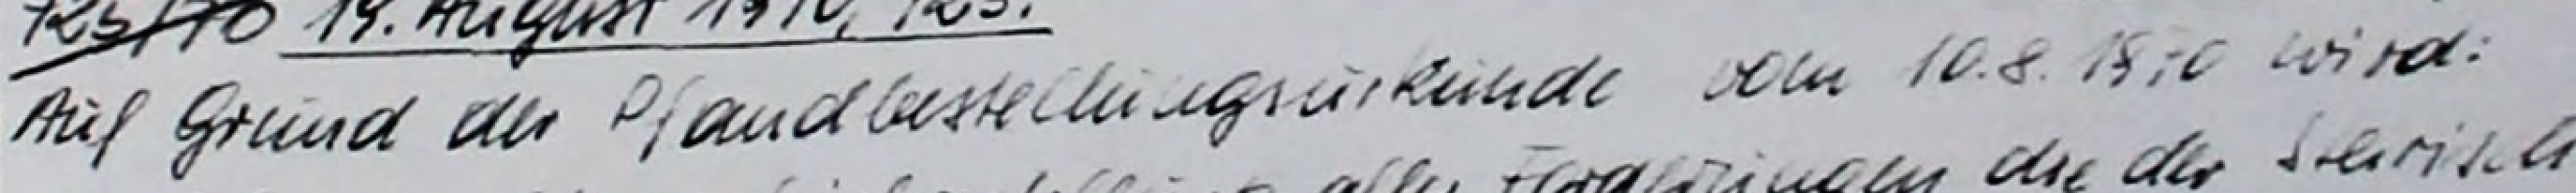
Auf Grund der Pfandbestellungsurkunde vom 10.8.1970 wird:
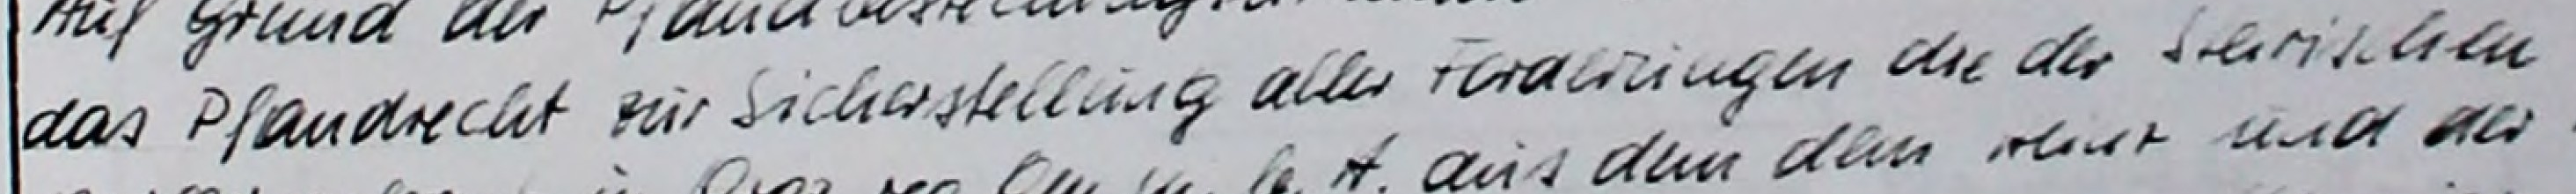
das Pfandrecht zur Sicherstellung aller Forderungen die der Steirischen
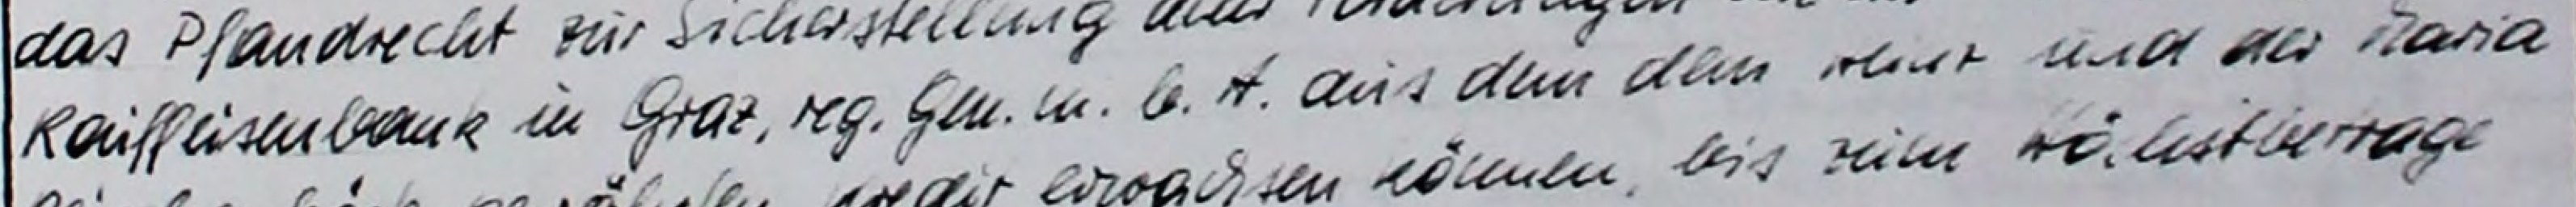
Raiffeisenbank in Graz, reg. Gen. m. C. H. Aus dem dem Heinz und der Maria
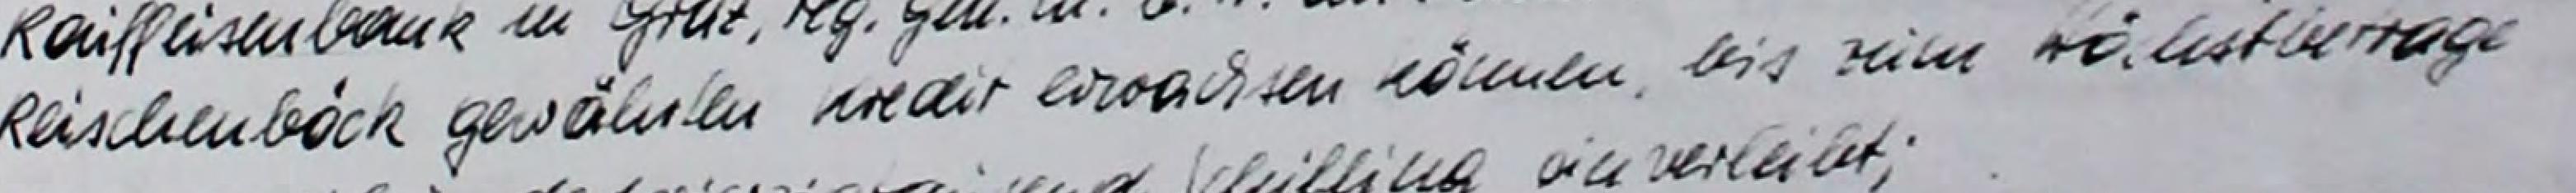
Reischenböck gewährten Kredit erwachsen können, bis zum Höchstbetrage
